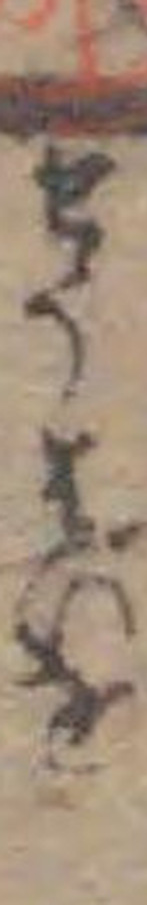せうばいを
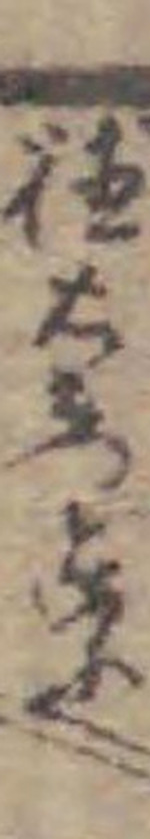徳右衛門といふ
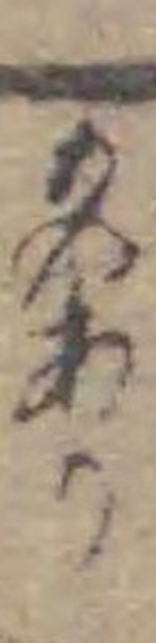ものあり
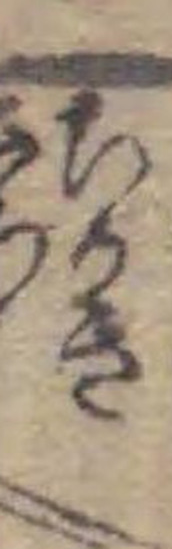ちから

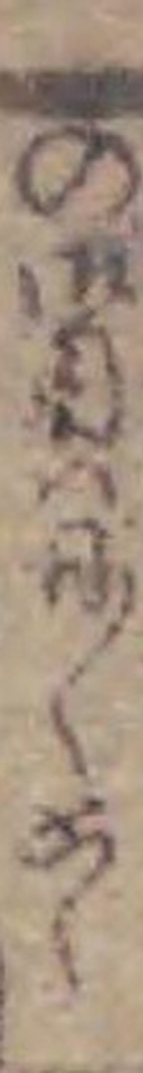の御用は日〳〵とく
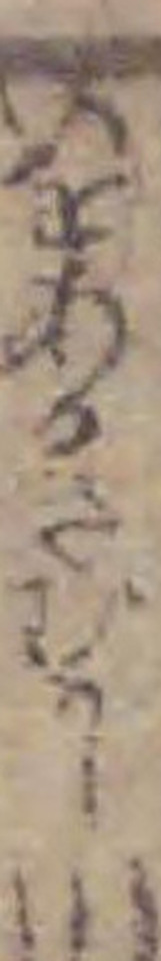いをあるきむかし
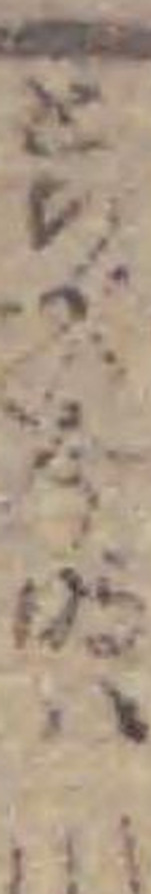とちかい今時は
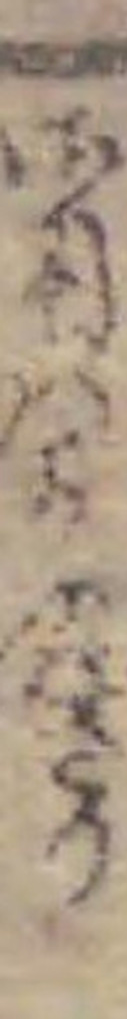御用はよふごさり
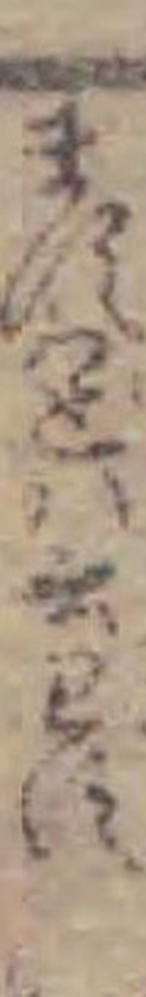ますかとはいわず
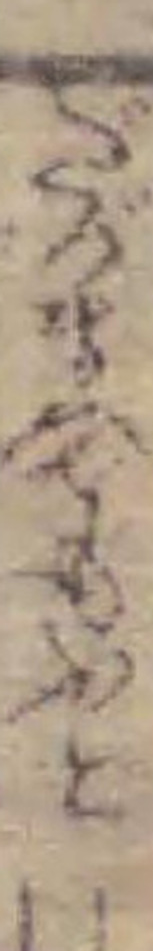だがまへてもふと
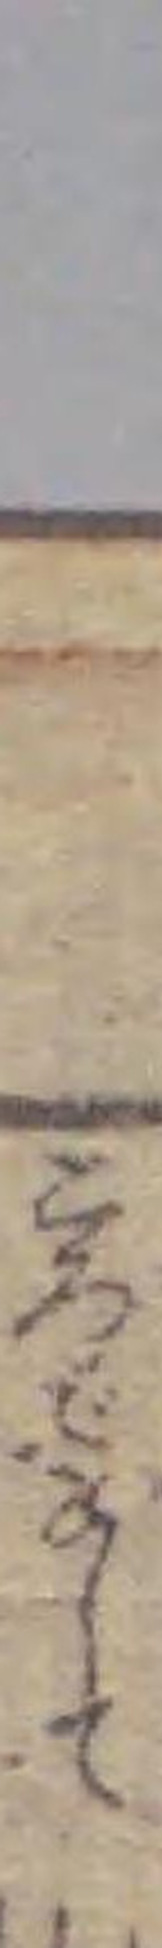ころでをして
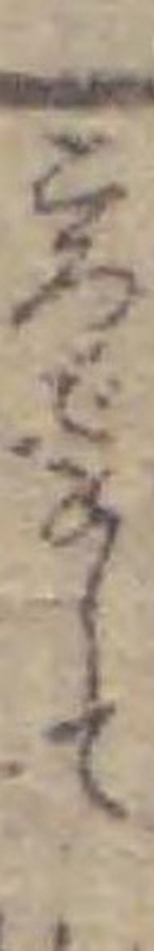ころでをして
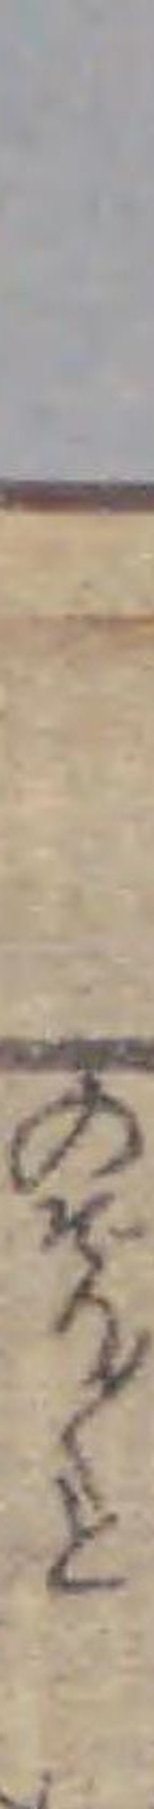のそり〳〵と
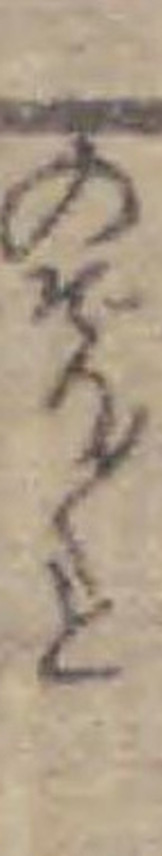のそり〳〵と
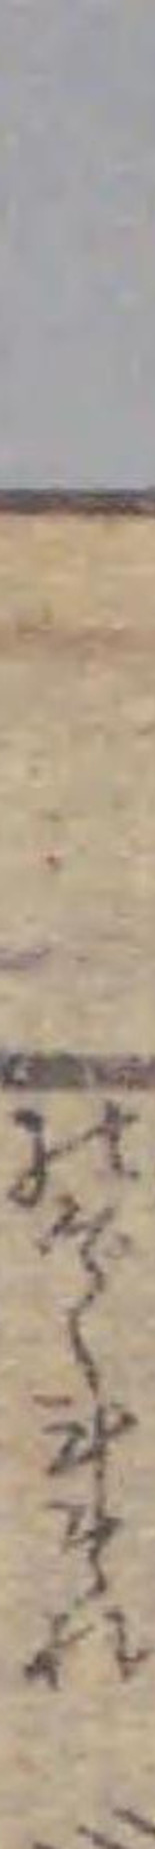のぞく斗それ
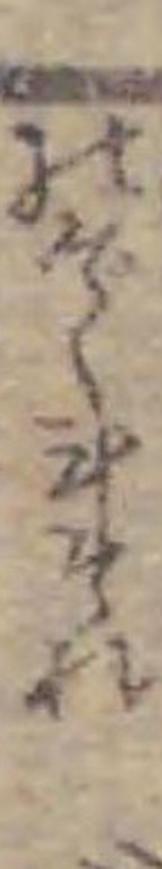のぞく斗それ
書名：通風伊勢物語 : 3巻
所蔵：国立国会図書館 National Diet Library, JAPAN
